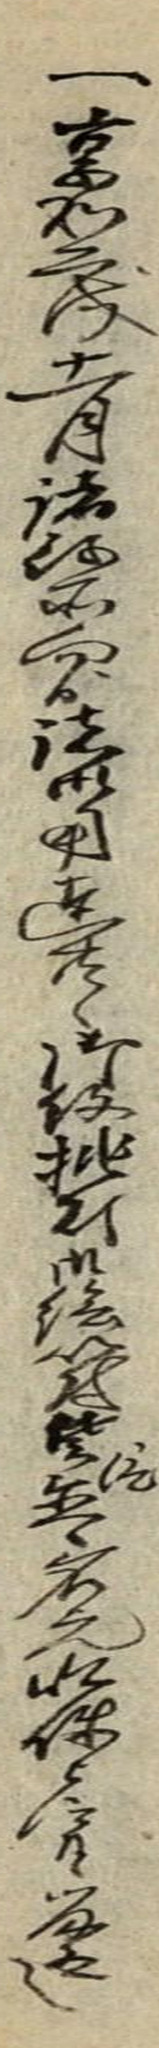一享和二戌十一月諸役所向ゟ諸御用達共へ御紋挑灯御絵符皆渡置候名元吟味被仰付留有之
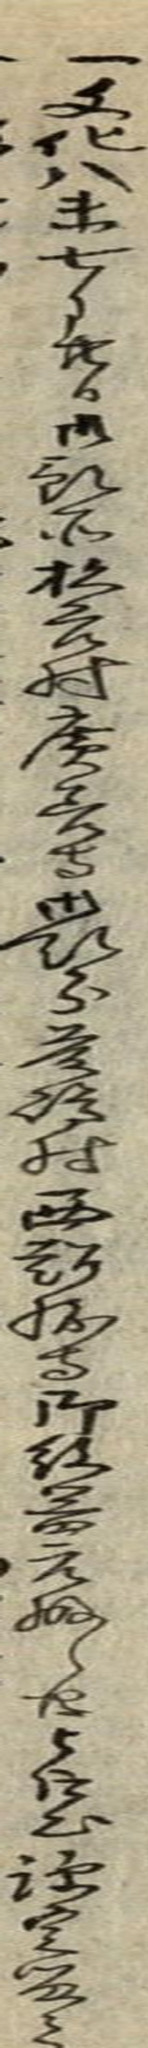一文化八未七月廿日御預所杉谷村広善寺御領分藤嶋村西超勝寺御紋器取扱之儀被仰出評定留に有之
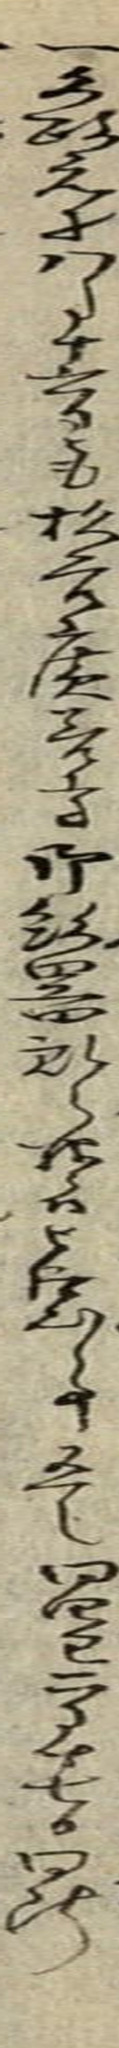一文政元寅八月十六日にも杉谷広善寺御紋器願之儀に付被仰出候事有之同四巳二月十七日同断
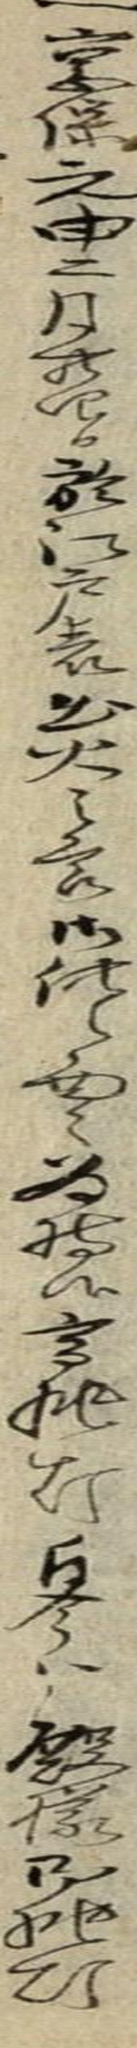一享保元申二月廿四日於江戸表出火之節御供之面々為持候高挑灯自今は殿様御挑灯
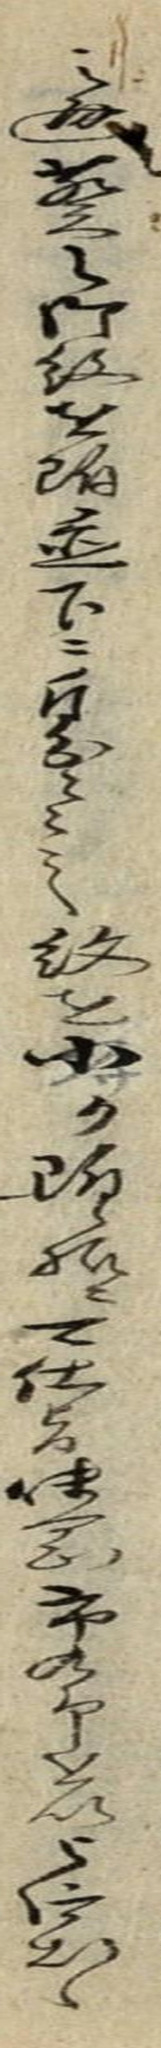之通葵之御紋を附置下に自分〃〃之紋を小く附候様に可仕候旨味岡市九郎を以被仰出候
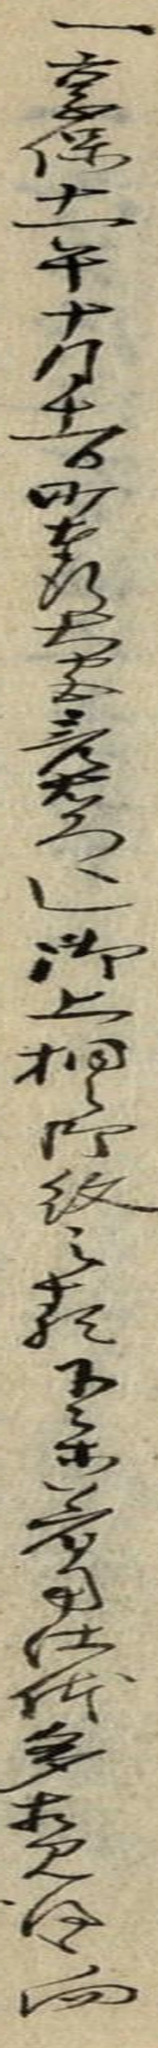一享保十一午十月十一日町奉行大宮彦右衛門へ」御上桐之御紋之類下々等着用仕体多相見得候向
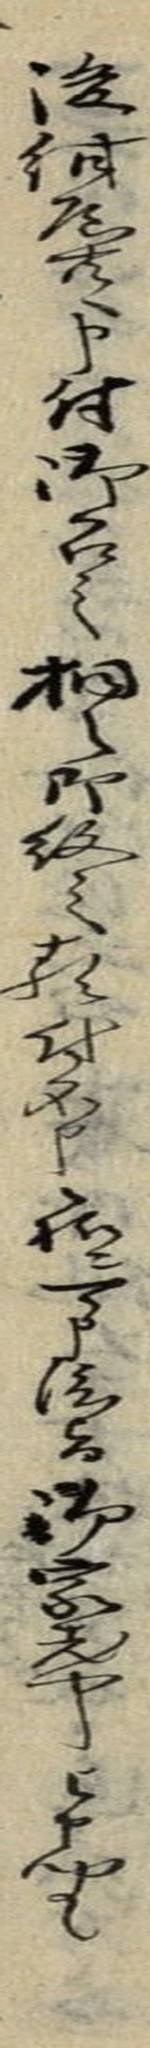後紺屋共へ申付御召之桐之御紋之類付不申候様に可申渡旨御家老中被申聞候
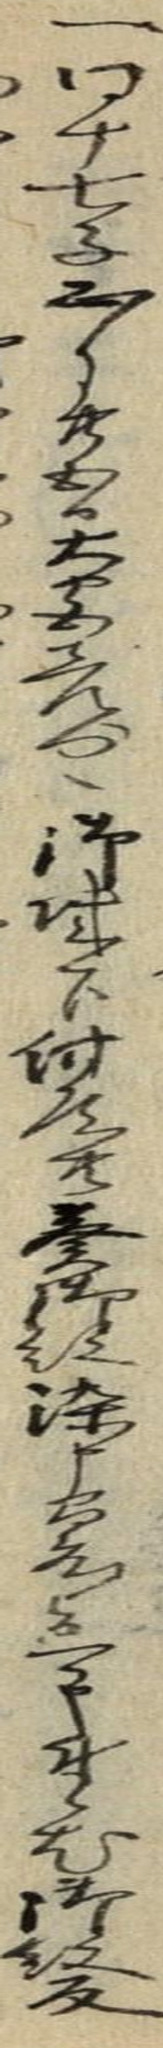一同十七子正月廿五日大宮彦右衛門へ御城下紺屋共葵御紋染申間敷旨可申付候尤御紋反
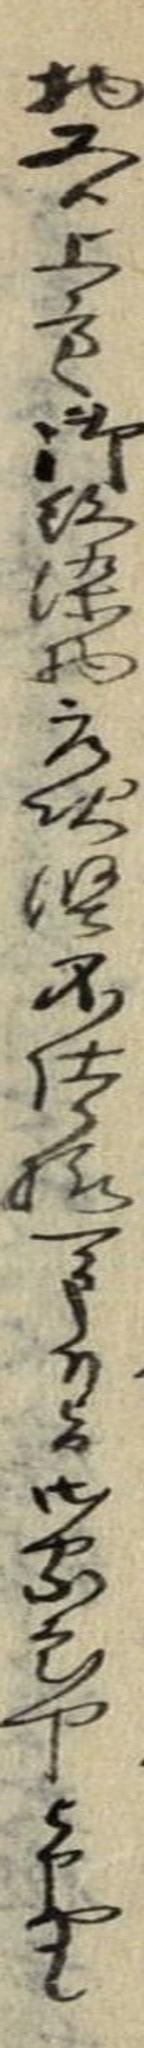物又は上方へ御紋染物取次堅不仕候様可申付旨御家老中被申聞候
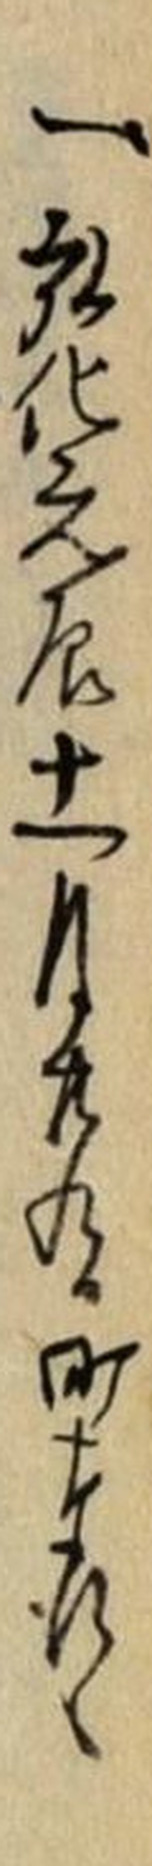一弘化元辰十一月廿九日町奉行へ
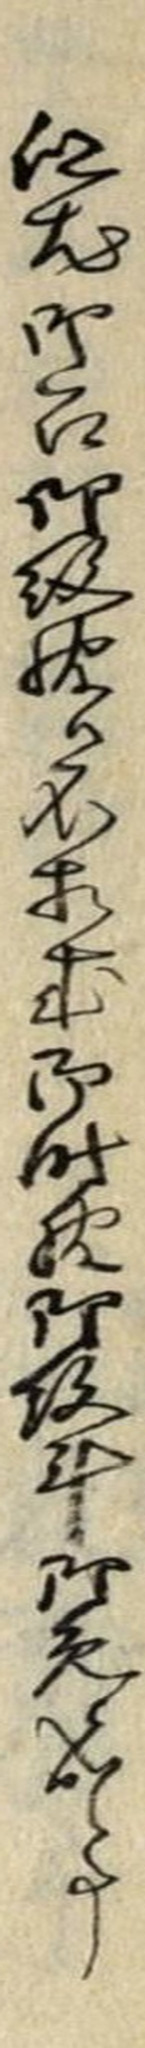但尤御召御紋服は不相成御時服御紋斗御免被成候事
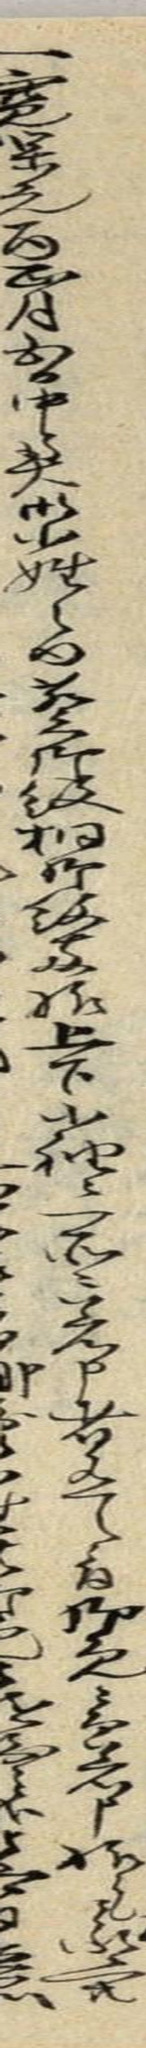一寛保元酉正月五日中之奥小姓之内葵御紋桐御紋両様上下小袖に一所に着申者有之候付御免に而着申様承及候へ共
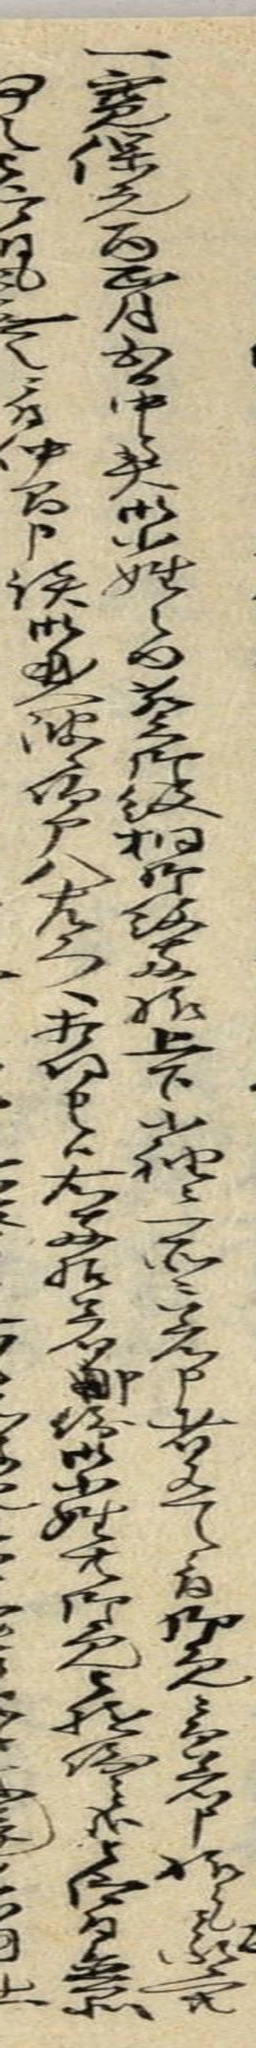何之被仰付も無之に付仲間申談御用人波々伯部八左衛門へ相伺申は右両様着申儀御小姓共御免被遊儀に候哉被仰付置品
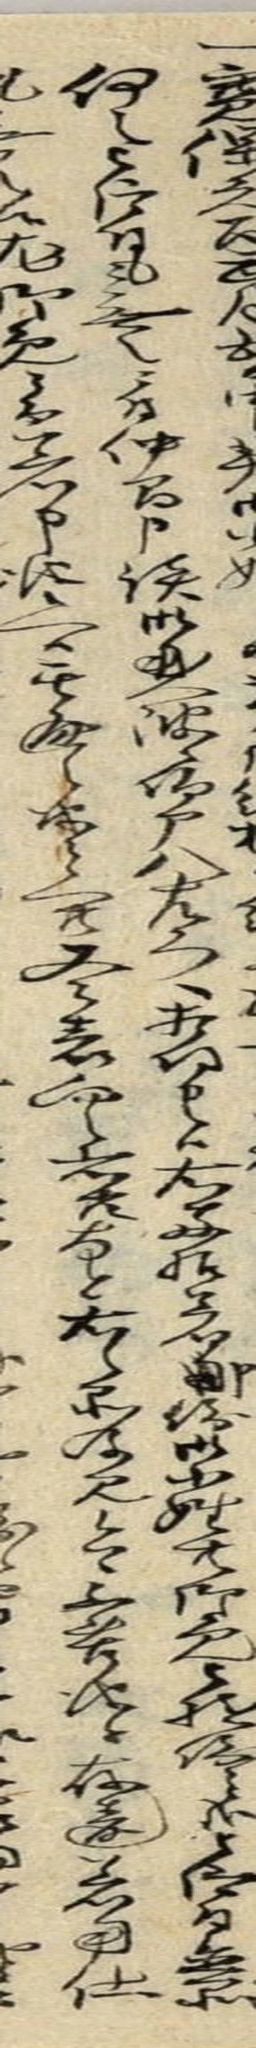も無之候尤御免に而着申儀に候へは其通之儀之儀に候へ共又々表向之者共なと右之品及見候はゝ不苦儀と存違着用仕
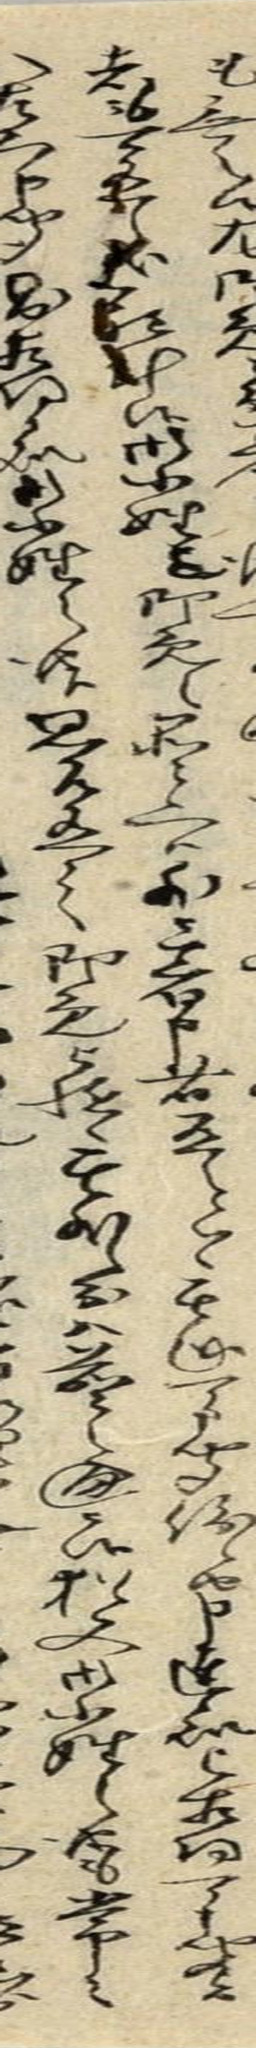八左衛門申聞即相伺候処御小姓之儀は思召有之御免被遊候其外之分は前々之通に候猶又御小姓之儀も常々
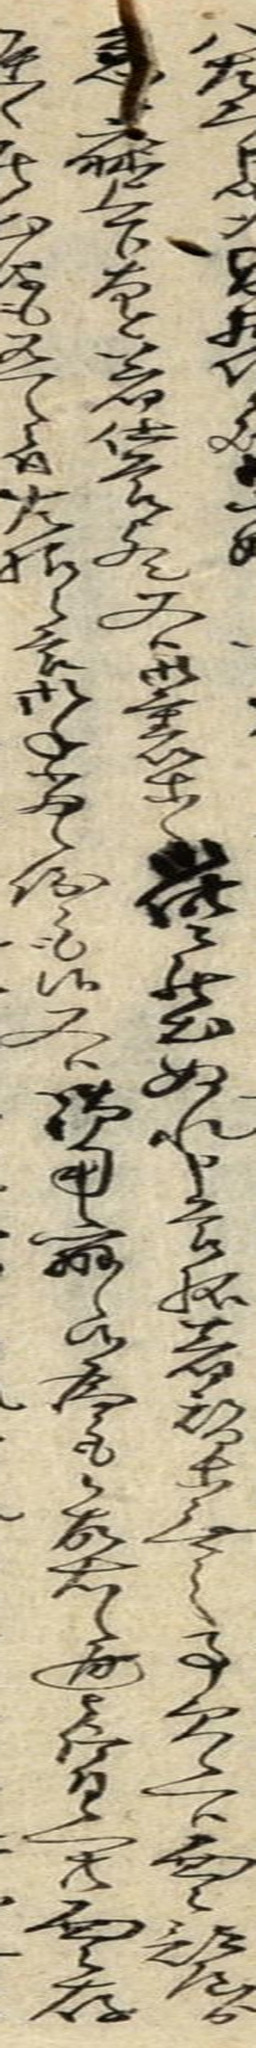遅く罷出候儀も有之候付左様之節御手当之儀にも候又は御用之辨に候為にも候故右之通被仰付候へ共面々存
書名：蒐輯之部
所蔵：福井県文書館 Fukui Prefectural Archives
